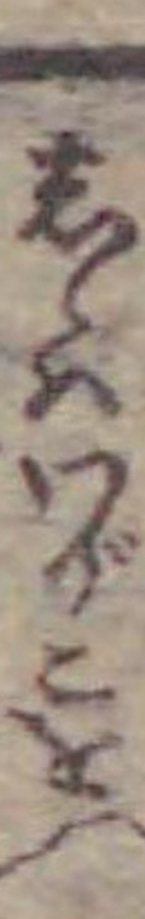しゝはわがこを
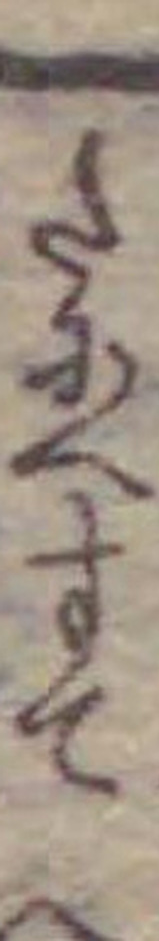たにへすて
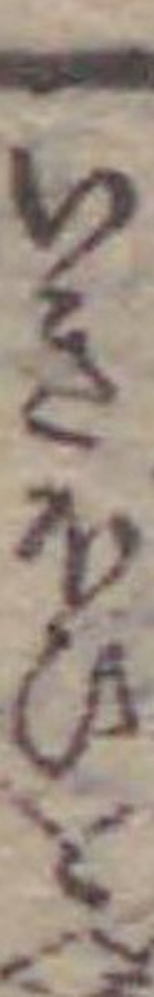いきほひを
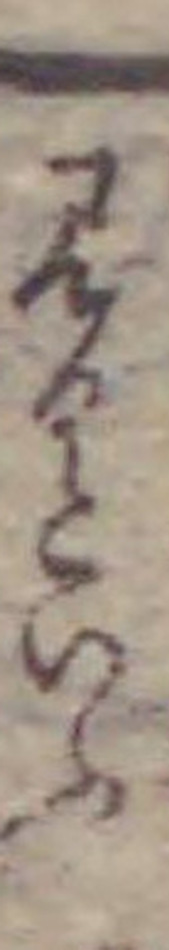見るといふ
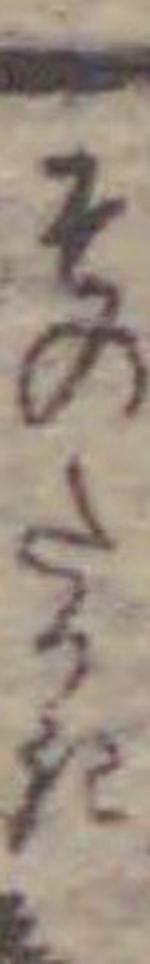そのたかき
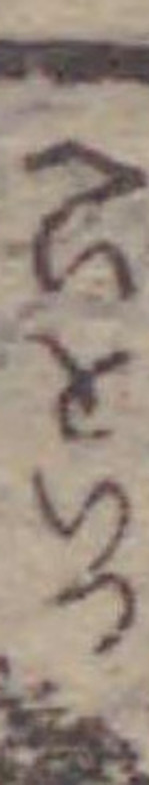へいをいつ
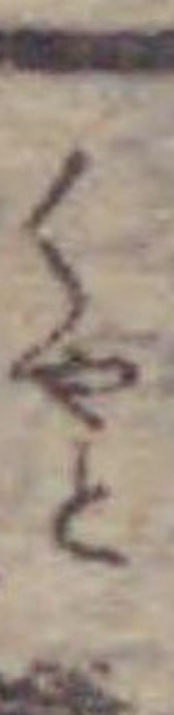くやと
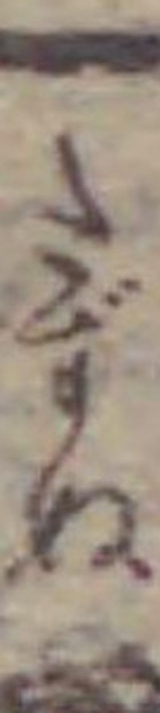たずぬ
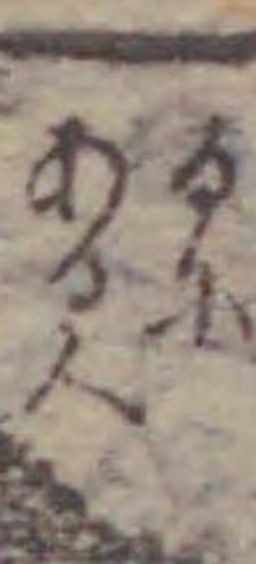ある人
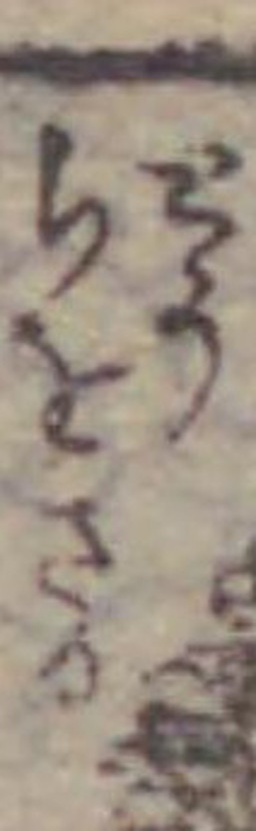ちをさる
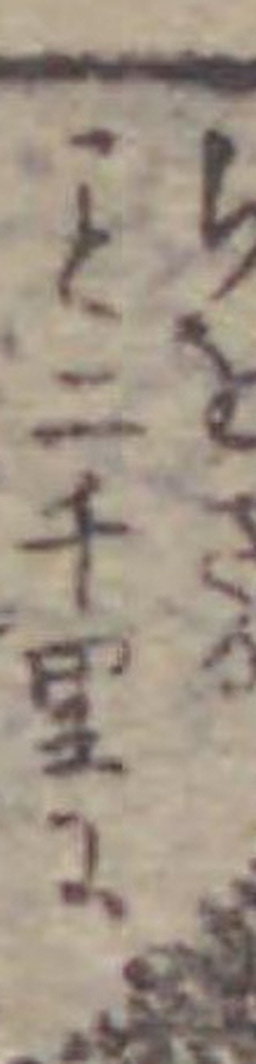こと二千里に
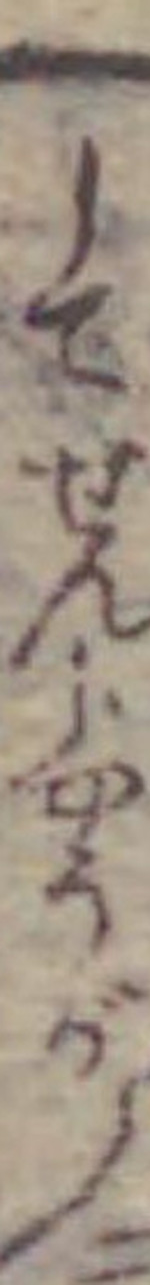してせんじやうが
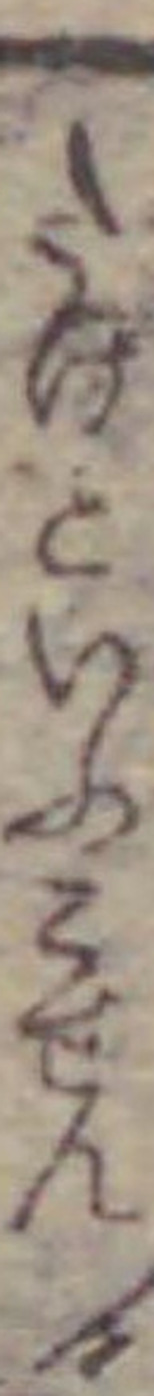たけといふこせん
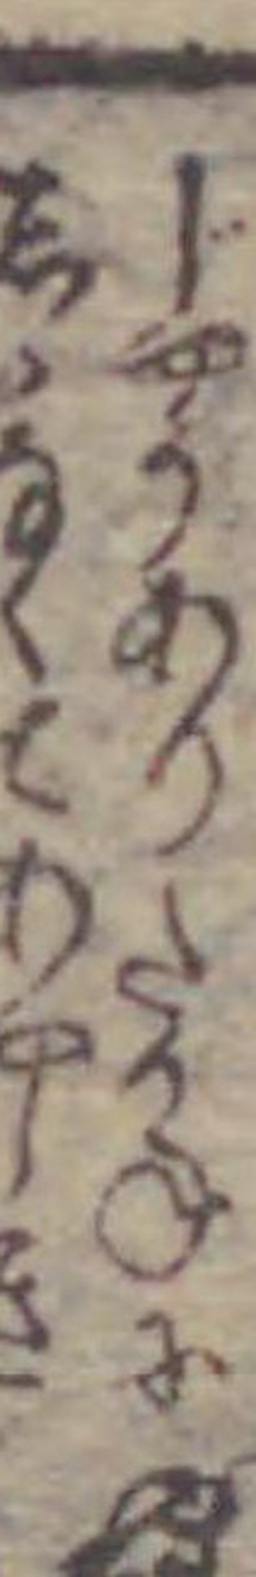しゝなくてあやしき
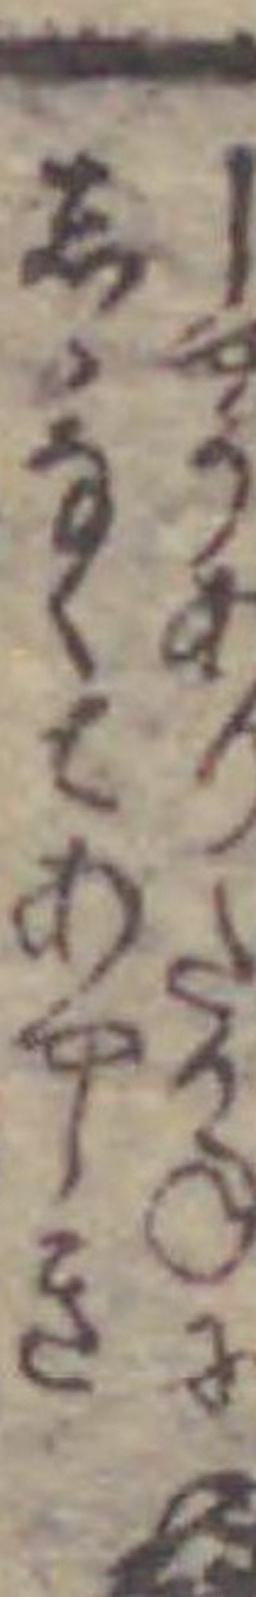しゝなくてあやしき
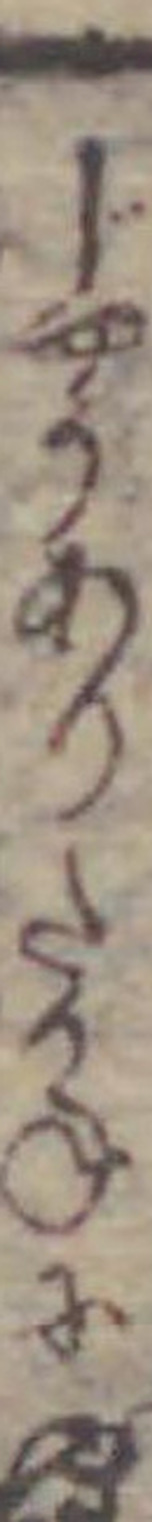じやうありたかねに
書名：武家物奇談 : 3巻
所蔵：国立国会図書館 National Diet Library, JAPAN
